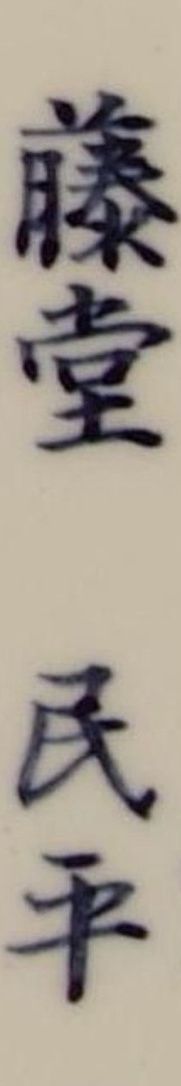藤堂民平
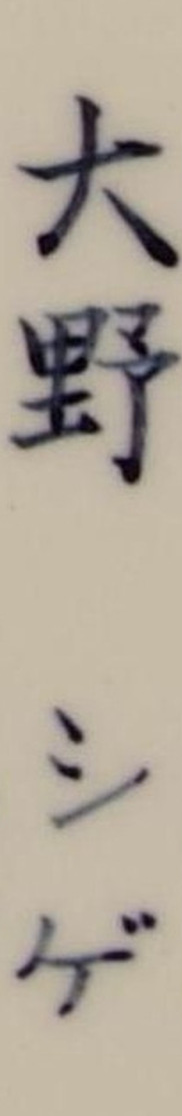大野シゲ
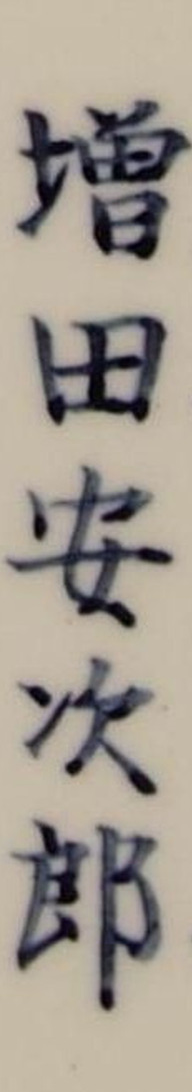増田安次郎
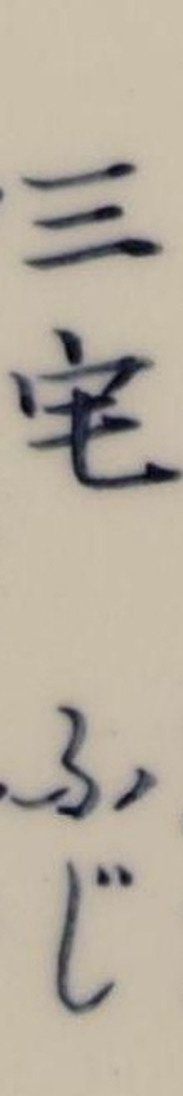三宅ふじ
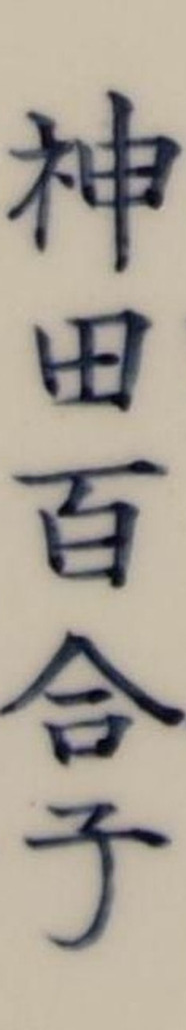神田百合子
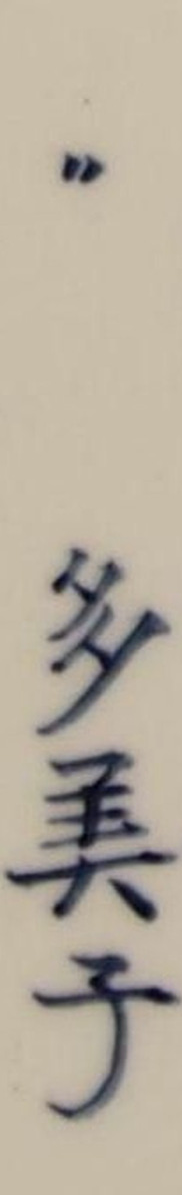多美子
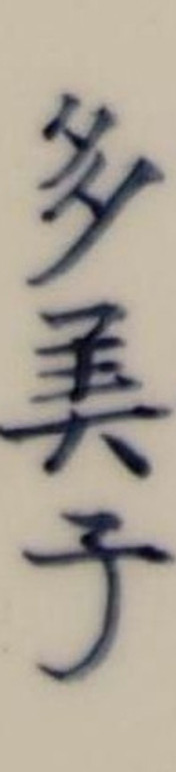多美子
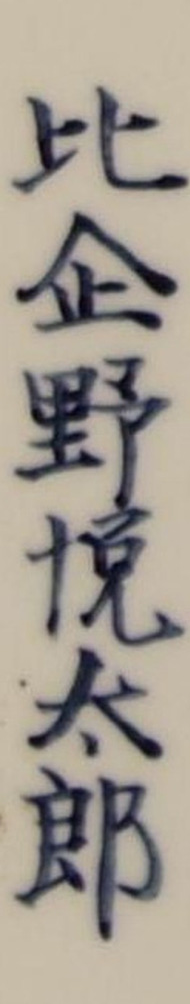比企野悦太郎
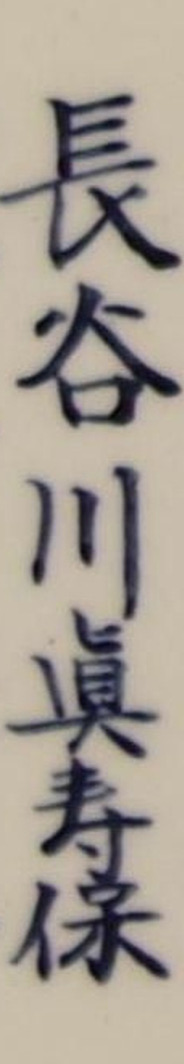長谷川真寿保
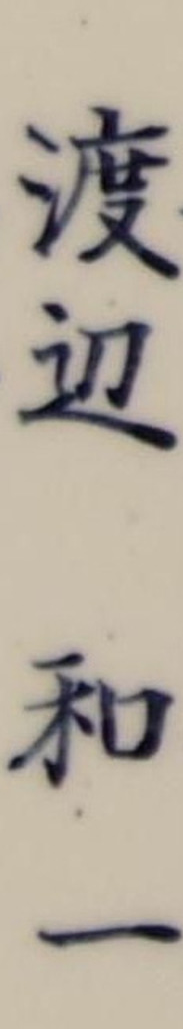渡辺和一
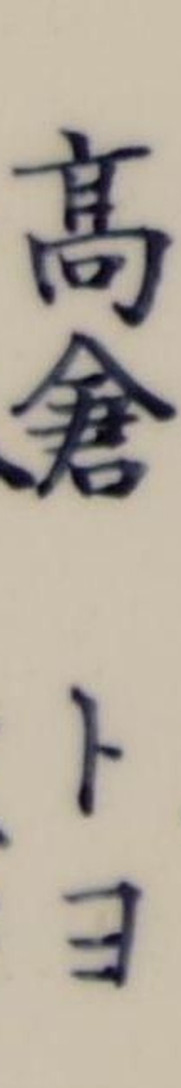高倉トヨ
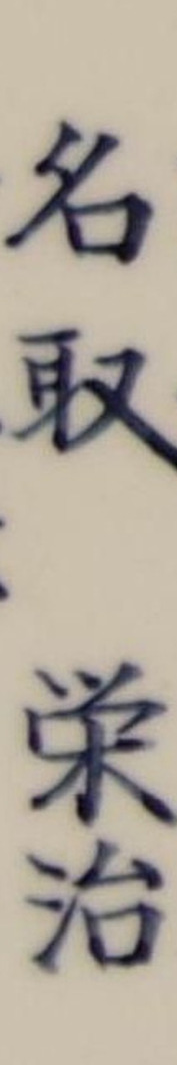名取栄治
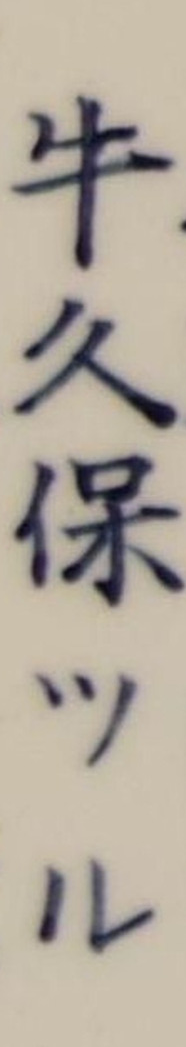牛久保ツル

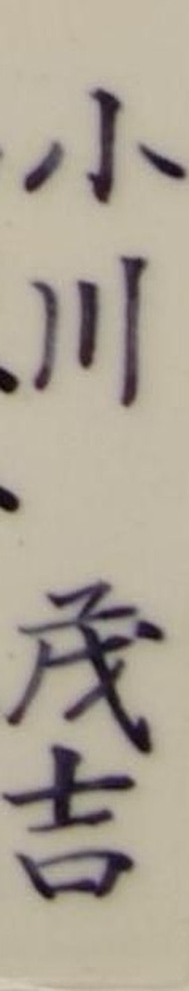小川茂吉
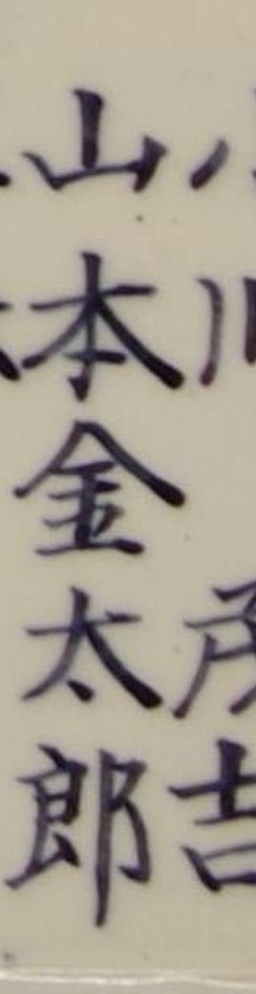山本金太郎
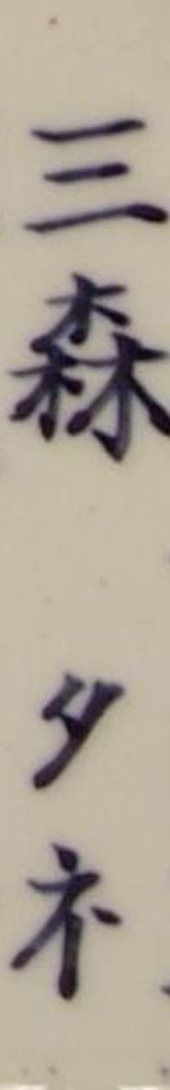三森夕ネ
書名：M~S
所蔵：高野山金剛峯寺
